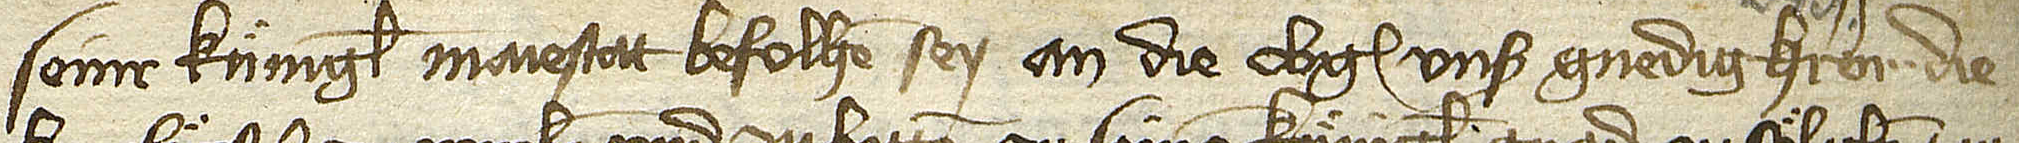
ſeinr künigl* maieſtat befolhe* ſey an die obg* vnſ* gnedig h*ren ~ die
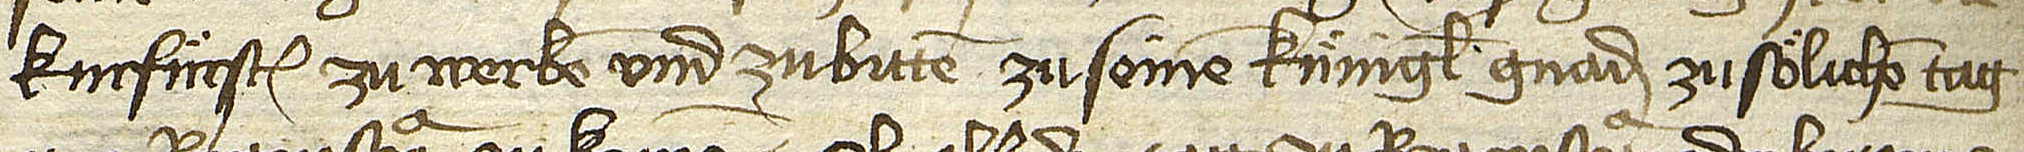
kurfürſt* ʒu werbe* vnd ʒu bitte* ʒu ſeine* künigl* gnad* ʒu ſöliche* tag
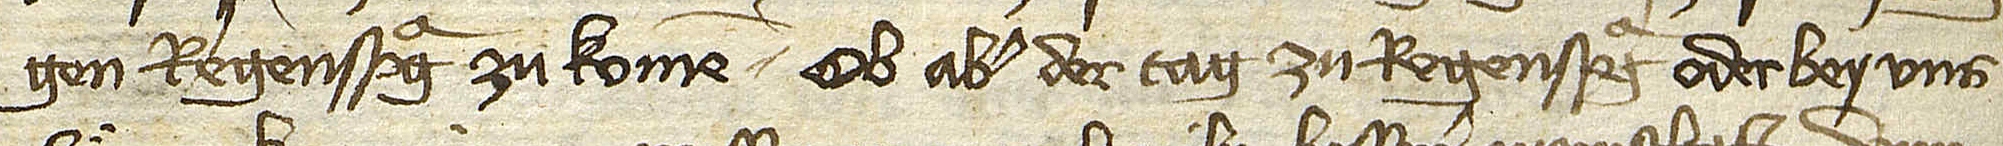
gen Regenſp*g ʒu kome* / Ob ab* der tag ʒu Regenſp*g oder bey vns
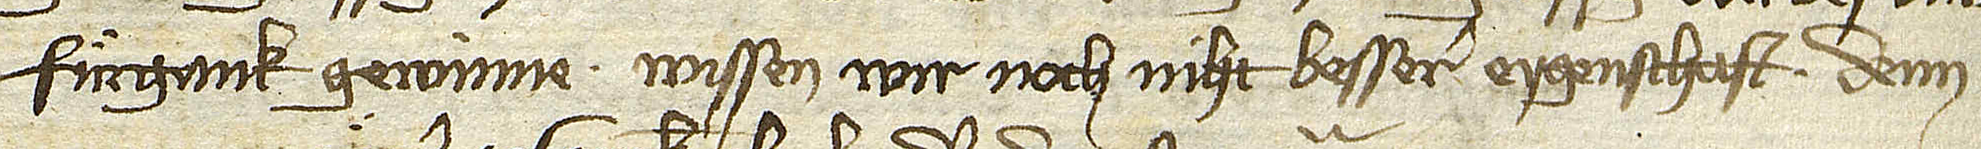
fürgank gewinne . wiſſen wir noch niht beſſer* eygenſchaft . denn
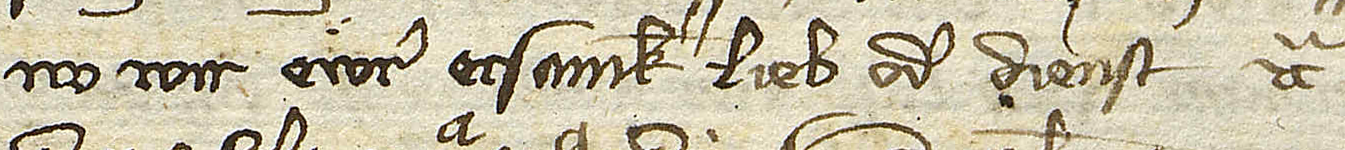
wo wir ew*r erſamk* lieb od* dienſt ec*
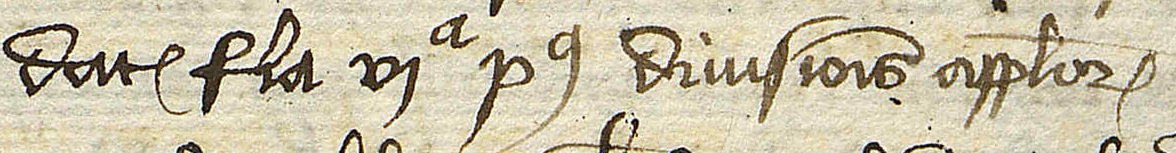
Dat* fia* vi* p* diuiſio*is applo*
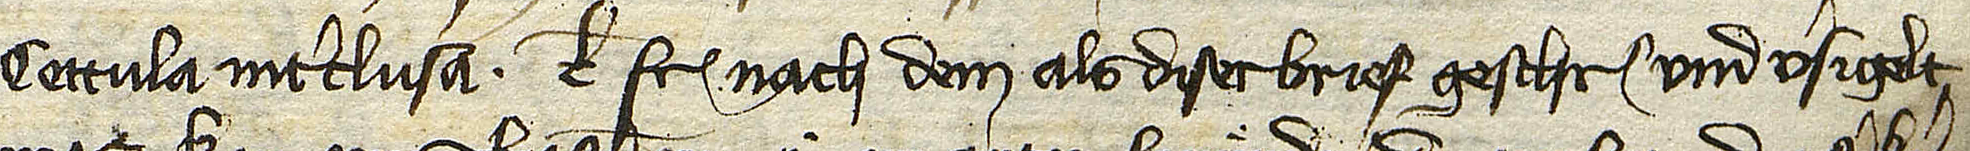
Cettula int*cluſa . L* fr* nach dem als diſer brief geſchr* vnd v*ſigelt
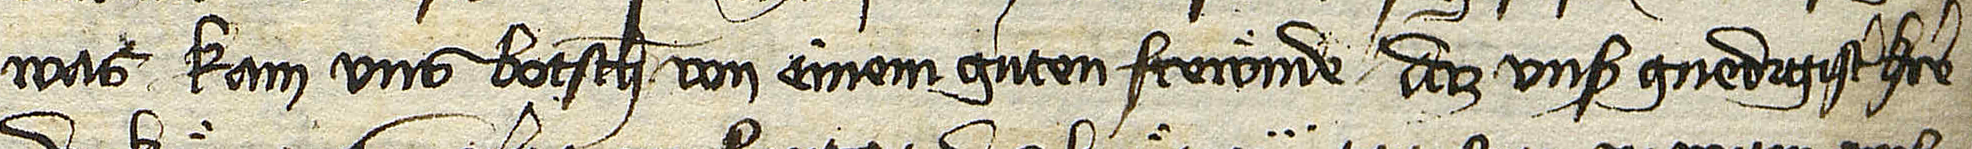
was kam vns botſch* von einem guten frewnde / daʒ vnſ* gnedigiſt* h*re
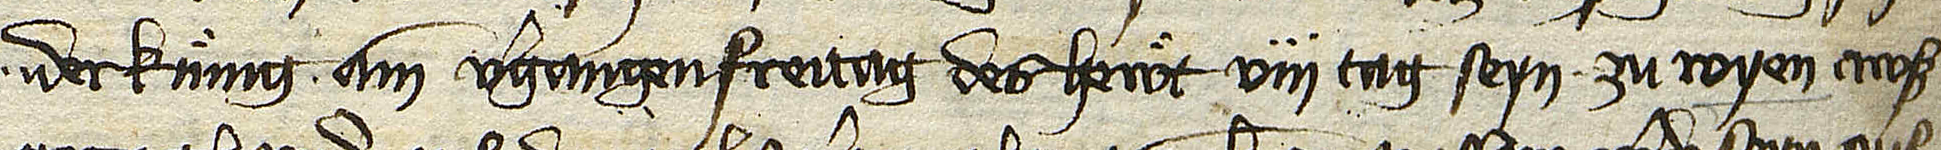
~ der künig . am* v*gangen freitag des hewt viii tag ſeyn . ʒu wyen awſʒ
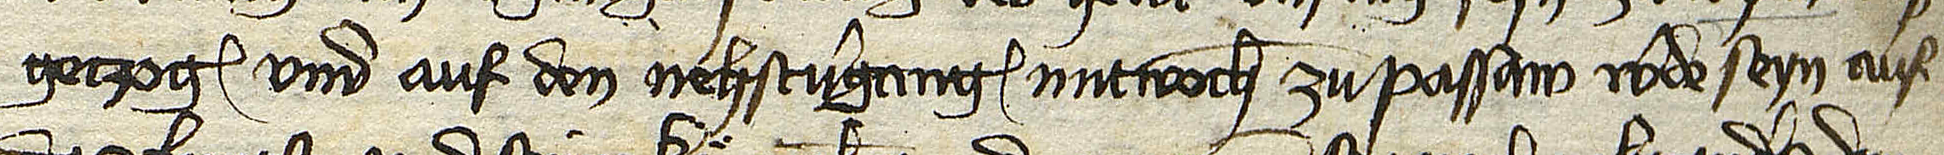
gecʒog* vnd auf den nehſtu*gang* mitwoch* ʒu Paſſaw w*de ſeyn auf
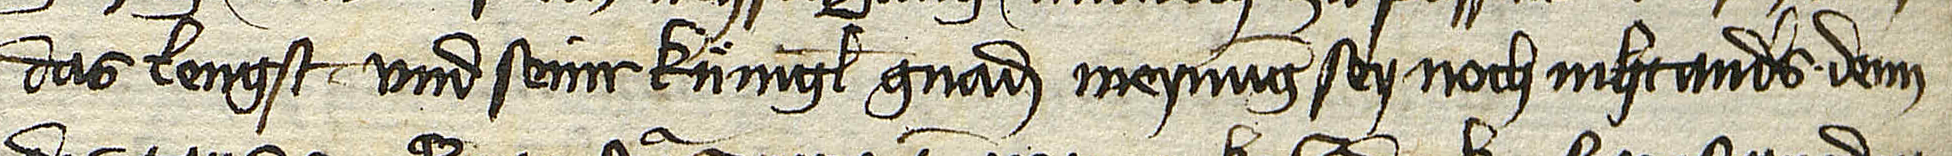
das lengſt / vnd ſeinr künigl* gnad* meynu*g ſey noch niht and*s . denn
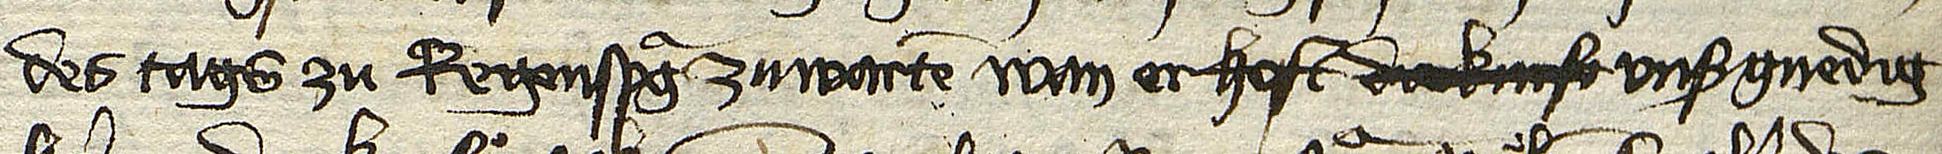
des tags ʒu Regenſp*g ʒu warte* wan er hoft . die kurf vnſ* gnedig
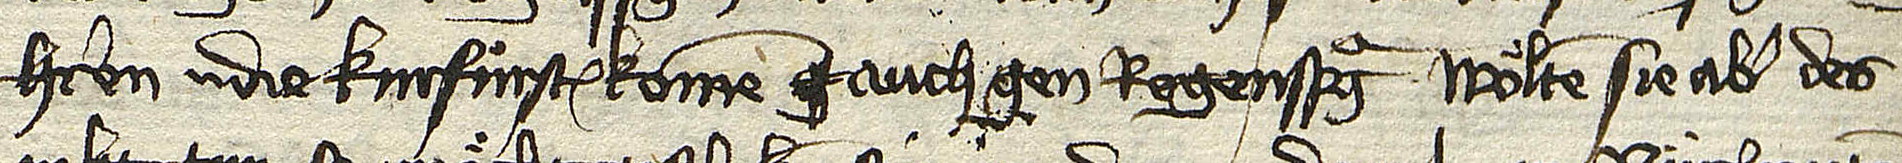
h*ren ~ die kurfürſt* kome* g auch gen Regenſp*g . Wölte* ſie ab* des
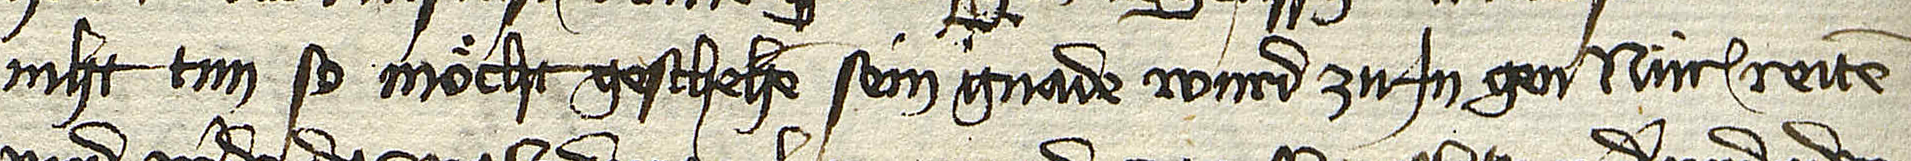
niht tun ſo möcht geſchehe* ſein gnade wurd ʒu In gen Nür* reite*
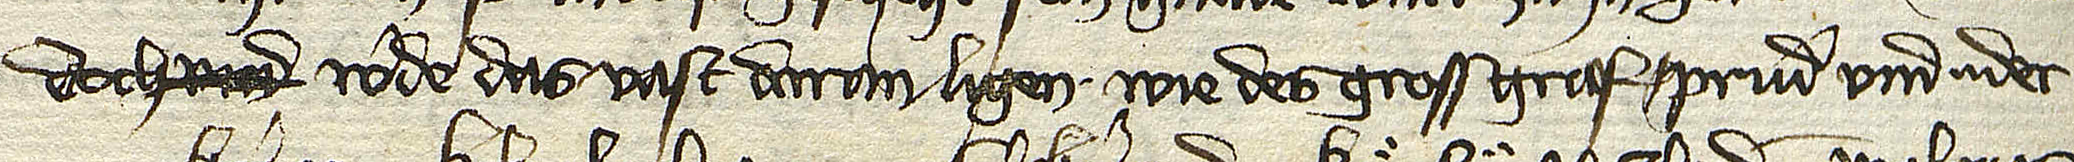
doch vnd w*de das vaſt daran ligen . wie des groſſ graf* prud* vnd ~ der
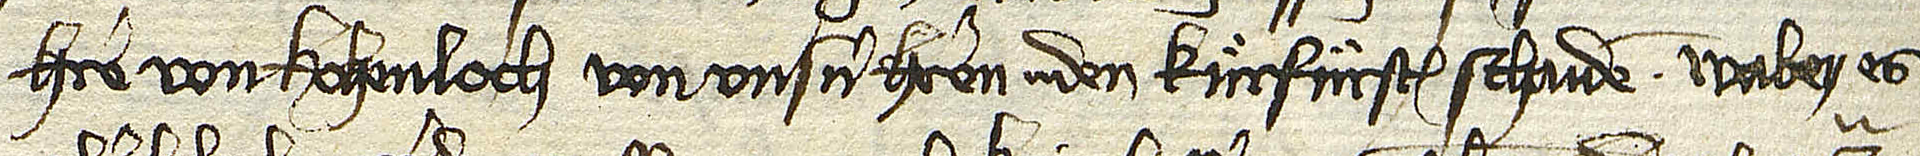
h*re von Hohenloch von vnſ*n h*ren ~ den kürfürſt* ſchaide* . wabey ey
